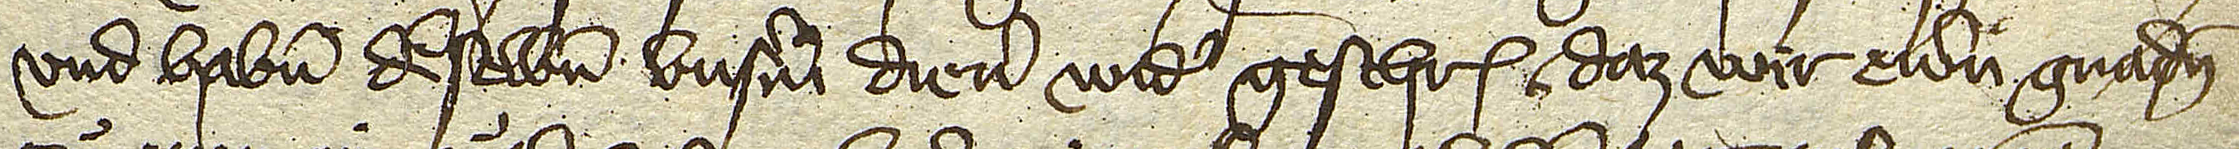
vnd habn* d*ſelbn* vnſm* dien* wid* geſchr* / daʒ wir ew*n gnadn*
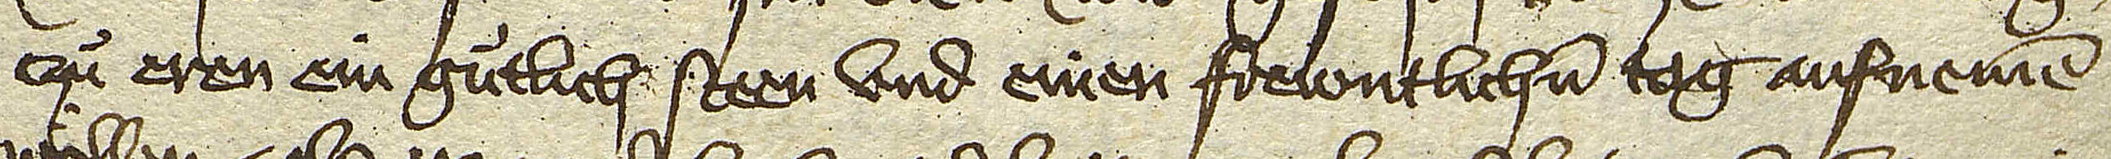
cʒü eren ein gütlich ſteen vnd einen frewntlichn* tag aufneme*
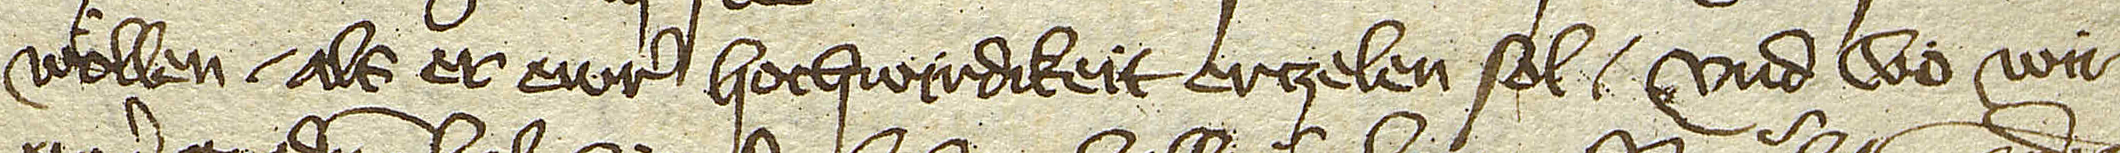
wöllen / als er ewr* hochwirdikeit ercʒelen ſol / vnd wo wir
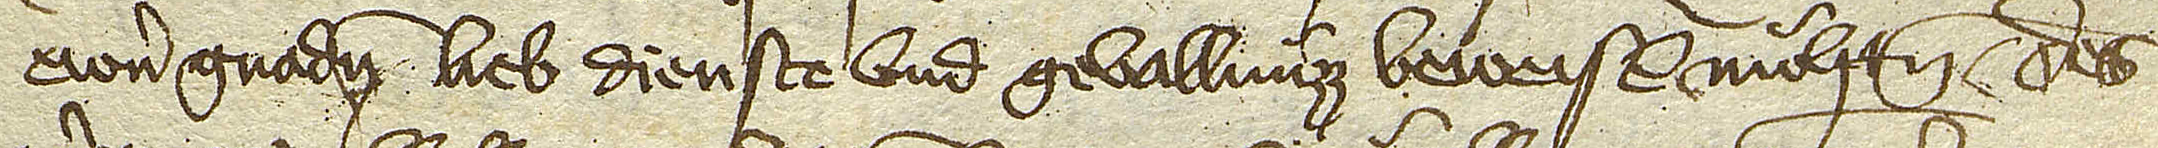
ewn* gnadn* lieb dienſte vnd gevallnüʒʒ beweiſe* möchtn* / Des
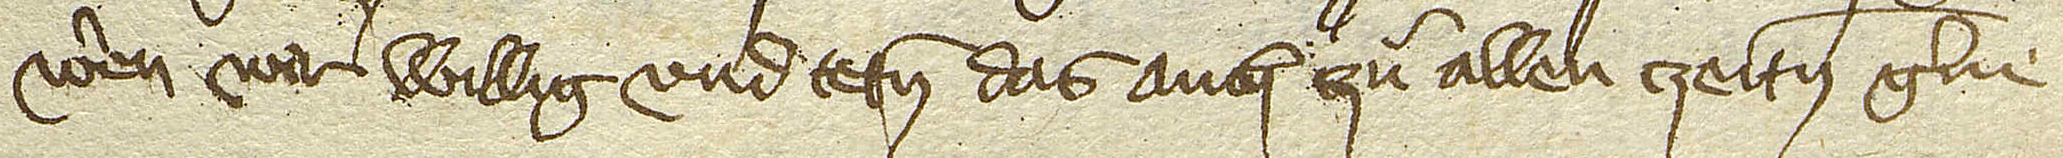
w*en wir willig vnd tetn* das auch cʒü allen cʒeitn* g*ne
